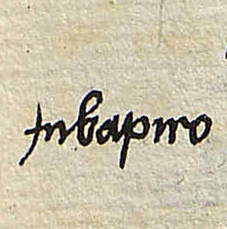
Inbapiro
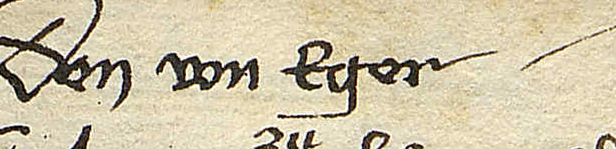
Den von Eger /
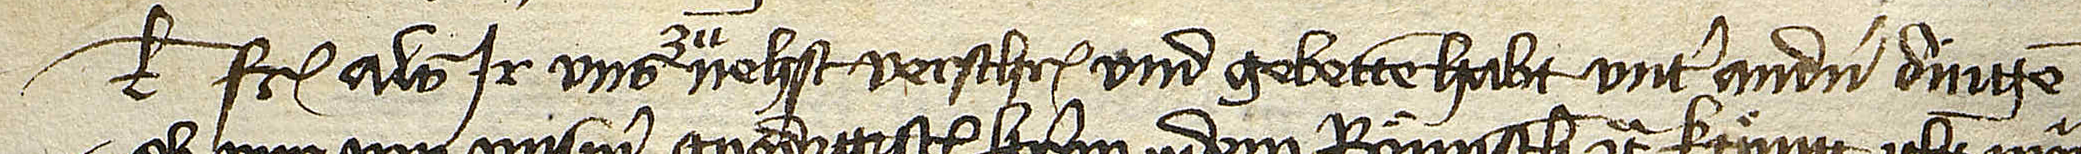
L* fr* als Ir vns nehſt verſchr* vnd gebette* habt vnt* andn* dinge*
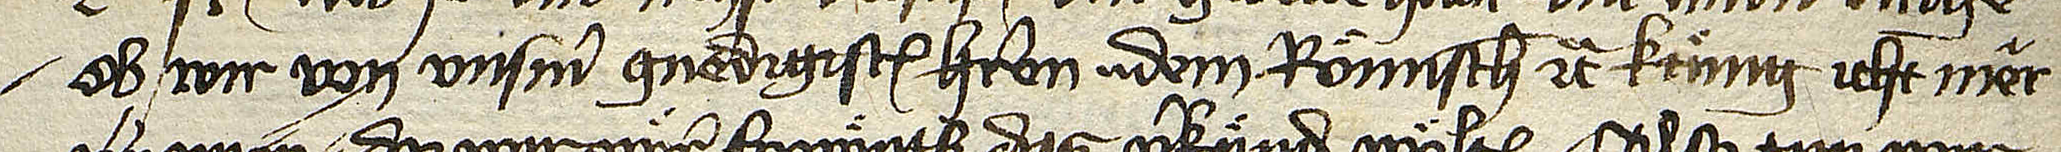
/ Ob wir von vnſm* gnedigiſt* hr*en ~ dem Römiſch* ec* künig icht mer*
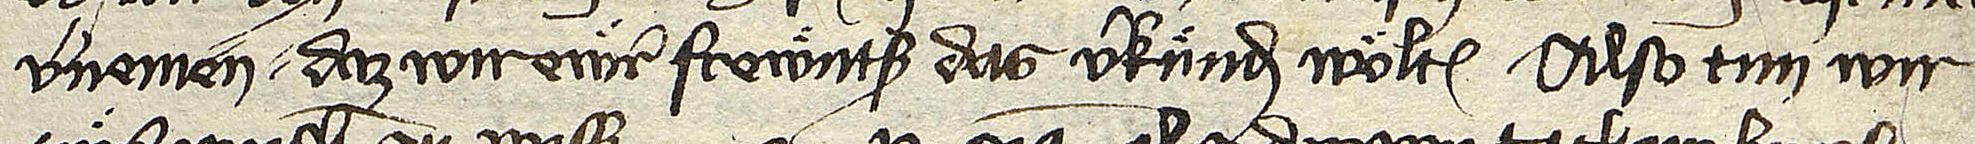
v*nemen / daʒ wir ewr* frewntſ* das v*künd* wölte* / Alſo tun wir
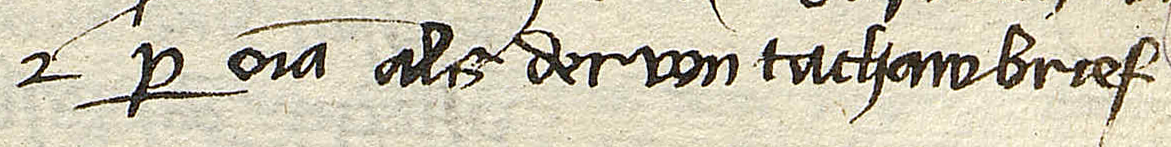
@ p* oia* als der von tachaw brief
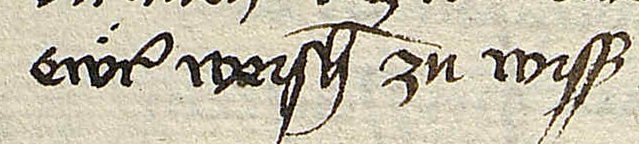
eẅr* weiſh* ʒu wiſſ*
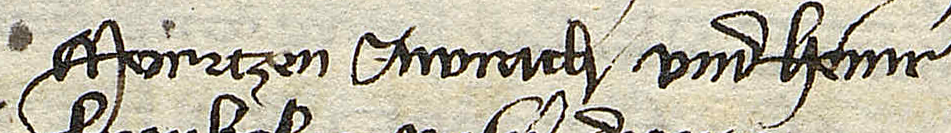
Moricʒen Awrach vnd Heinr*
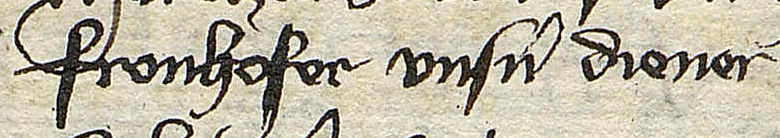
fronhofer vnſn* diener
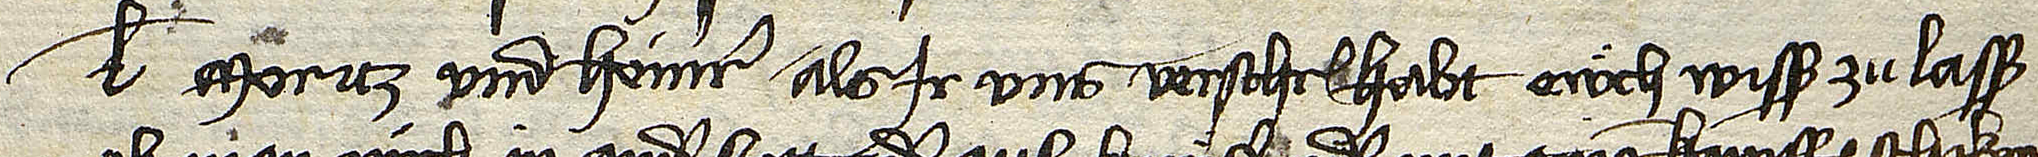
L* Moricʒ vnd Heinr* / als Ir vns verſchr* habt ewch wiſſ* ʒu laſſ*
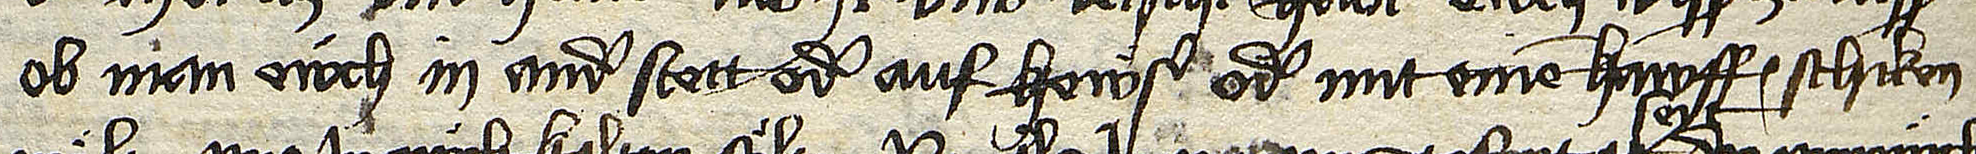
ob man ewch in and* ſtett od* auf hewſ* od* mit eine* hawff* ſchiken
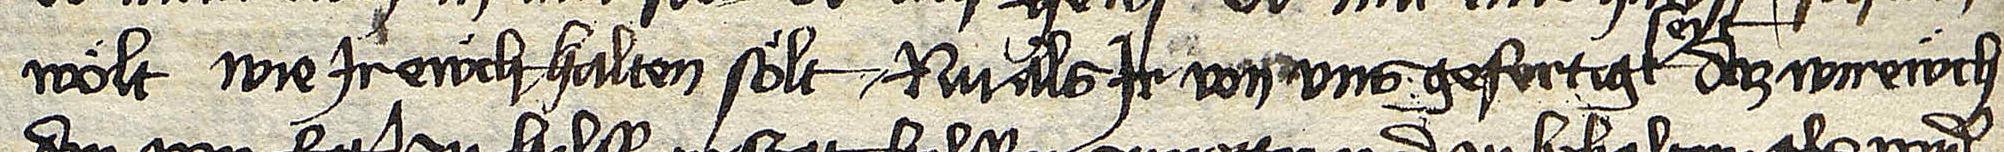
wölt wie Ir ewch halten sölt / Nu als Ir von vns gefertigt daʒ wir ewch
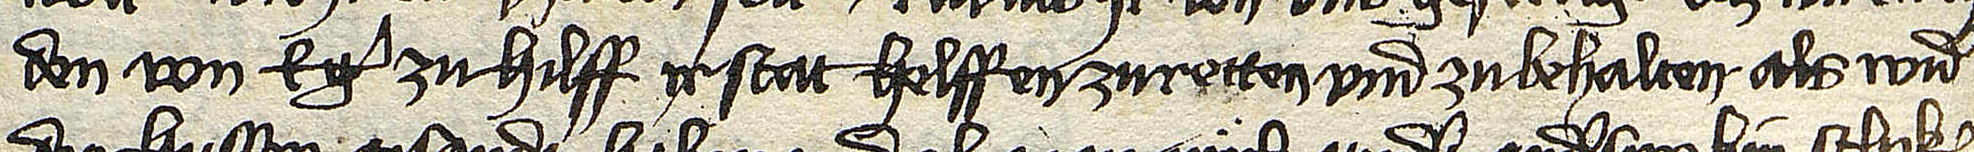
den von Eg* ʒu hilff ir ſtat helffen ʒuretten vnd ʒubehalten / als wid*
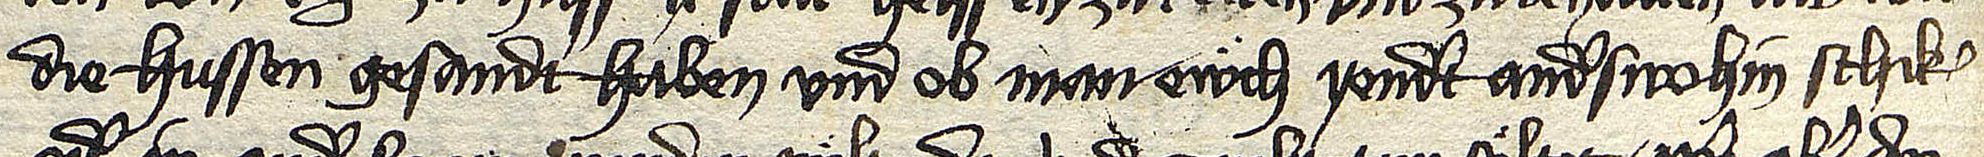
die huſſen geſandt haben vnd ob man ewch yendt* and*ſwohin ſchik*
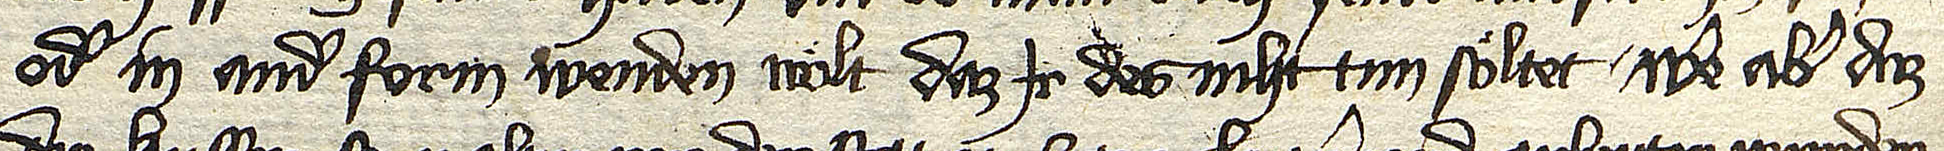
od* in and* form wenden wölt daʒ Ir des niht tun ſöltet / w*e ab* daʒ
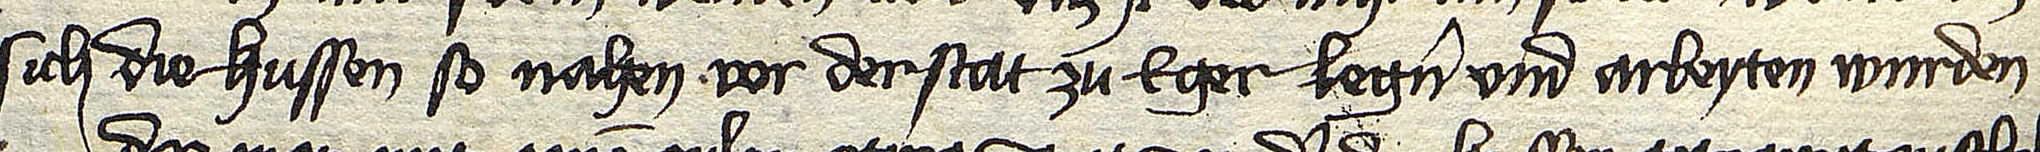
ſich die huſſen ſo nahen . vor der ſtat ʒu Eger legn* vnd arbeyten wurden
